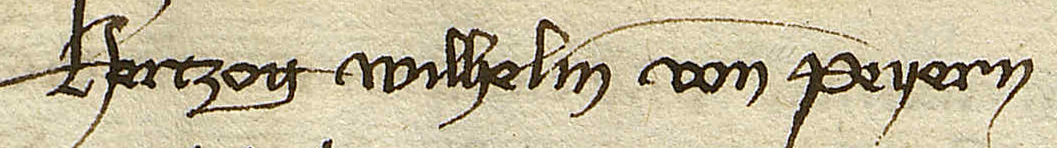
Hercʒog wilhelm* von Peyern
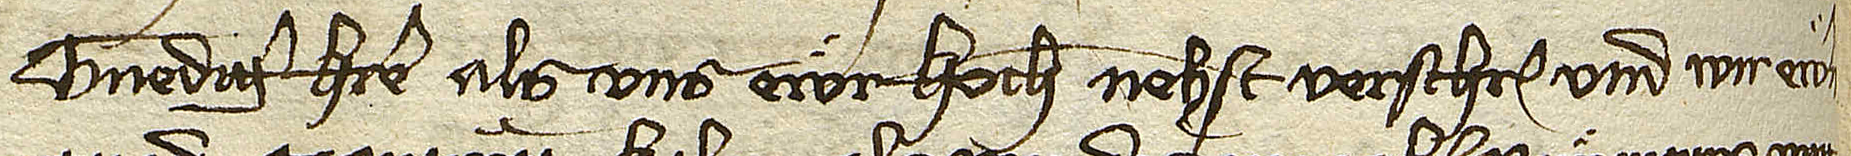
Gnedig* h*re als vns eẅr hoch* nehſt verſchr* vnd wir eẅ*n
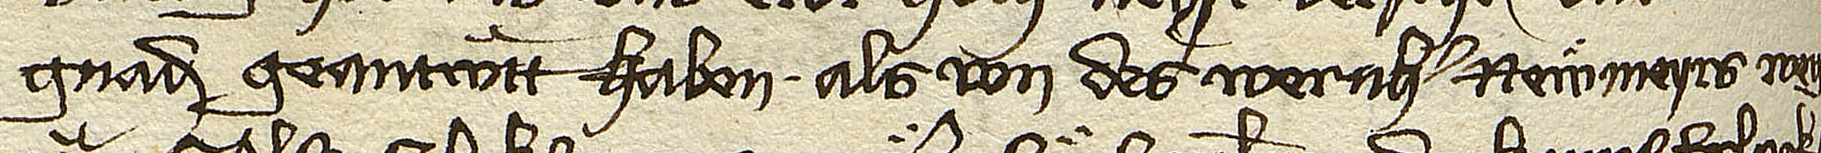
gnad* geantw*tt haben . als von des wernh* Neẅmeyrs weg*
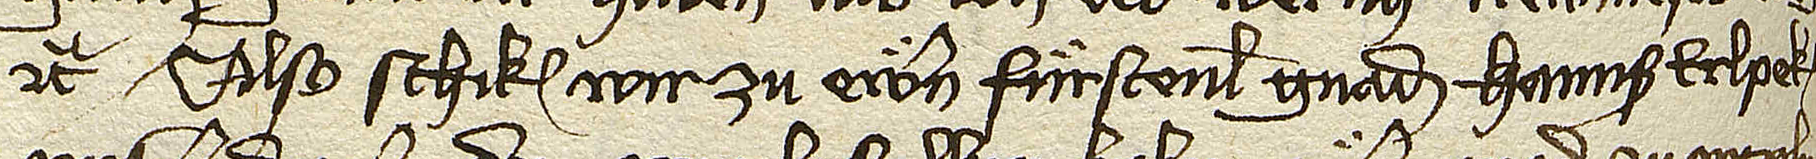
ec* / Alſo ſchik* wir ʒu eẅ*n fürſtenl* gnad* hannſ* Erlpek*
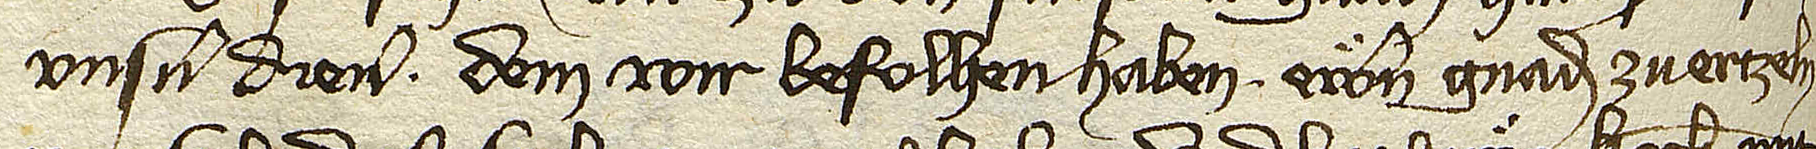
vnſ*n dien* . dem wir befolhen haben . eẅ*n gnad* ʒu ercʒeln
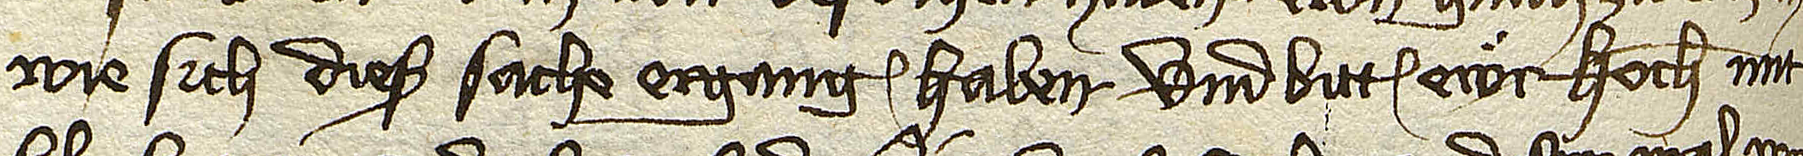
wie ſich dieſ* ſache ergang* haben Vnd bitt* eẅr hoch* mit
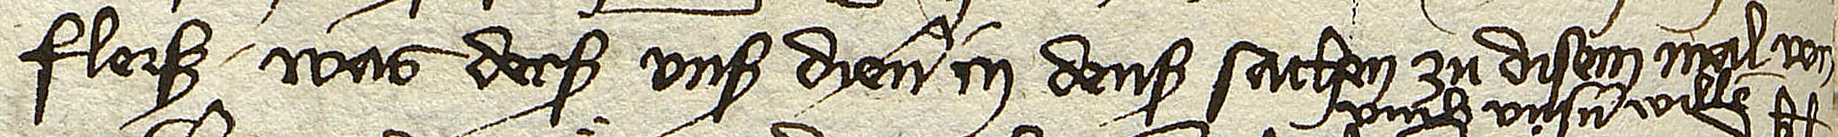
fleiſʒ / was derſ* vnſ* dien* in denſ* ſachen ʒu diſem mal von
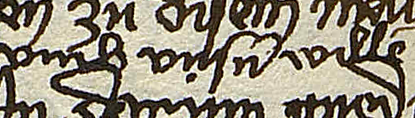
vmb vnſ*n wille*
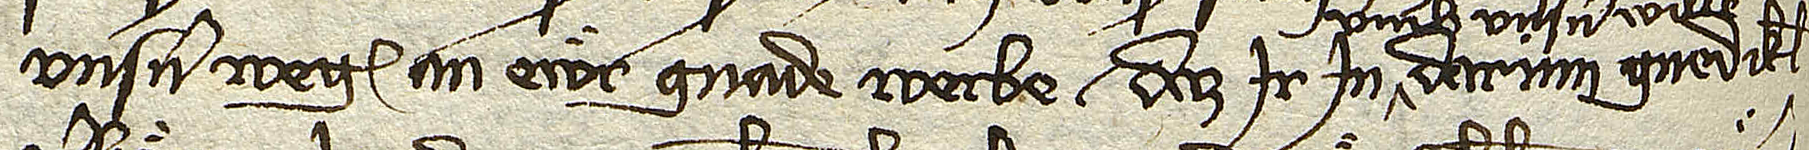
vnſ*n weg* an eẅr gnade werbe / Daʒ Ir In darinn gnedikl*
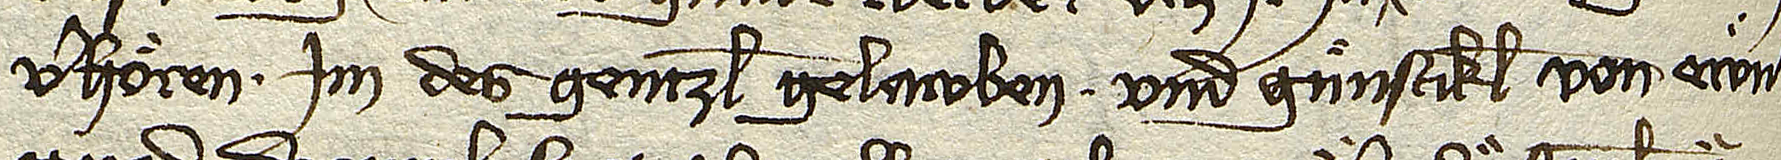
v*hören . Im des gencʒl* gelawben . vnd günſtikl* von eẅ*n
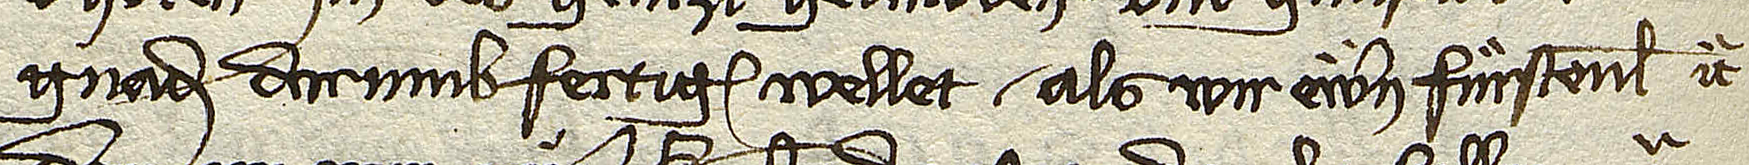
gnad* darumb fertig* wellet / als wir eẅ*n fürſtenl* ec*
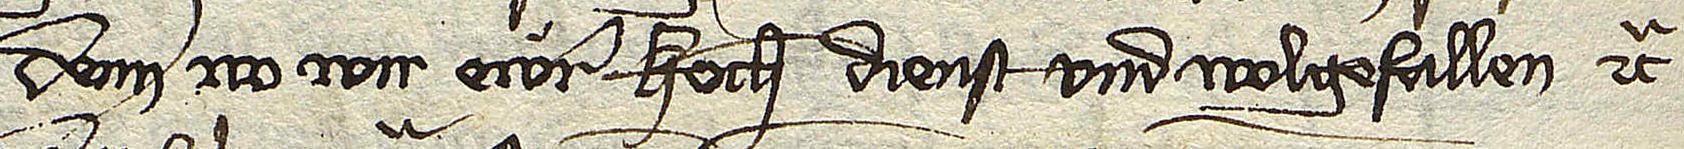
Denn wo wir eẅr* hoch* dienſt vnd wolgefallen ec*
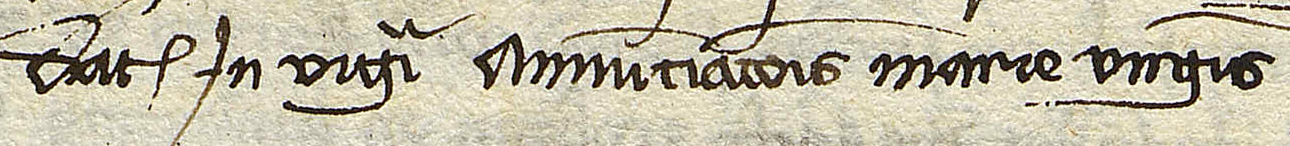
Dat* In * vigi* Annuciacois* marie virgis*
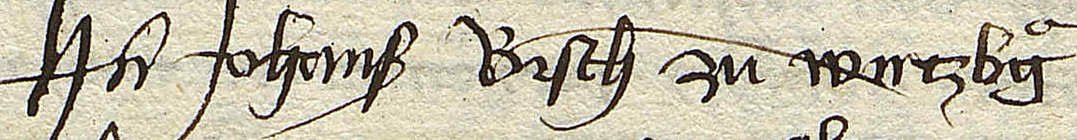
H*n Iohanſ* Biſch* ʒu wircʒb*g
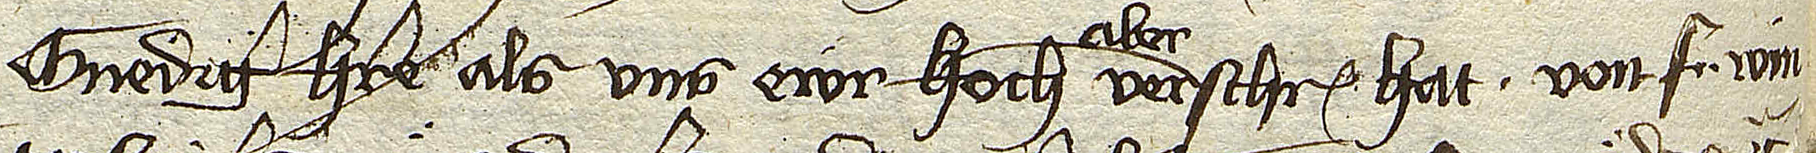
Gnedig* h*re als vns eẅr hoch* verſchr* hat . von f . win
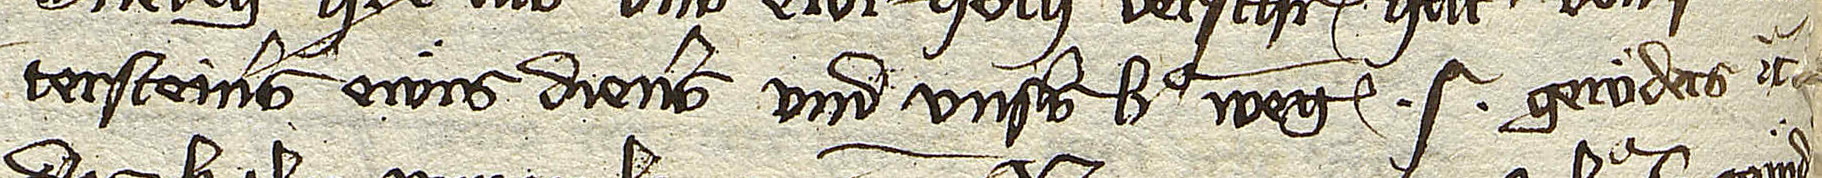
terſtein*s eẅrs dien*s vnd vnſ*s b* weg* . ſ . geẅders ec*
